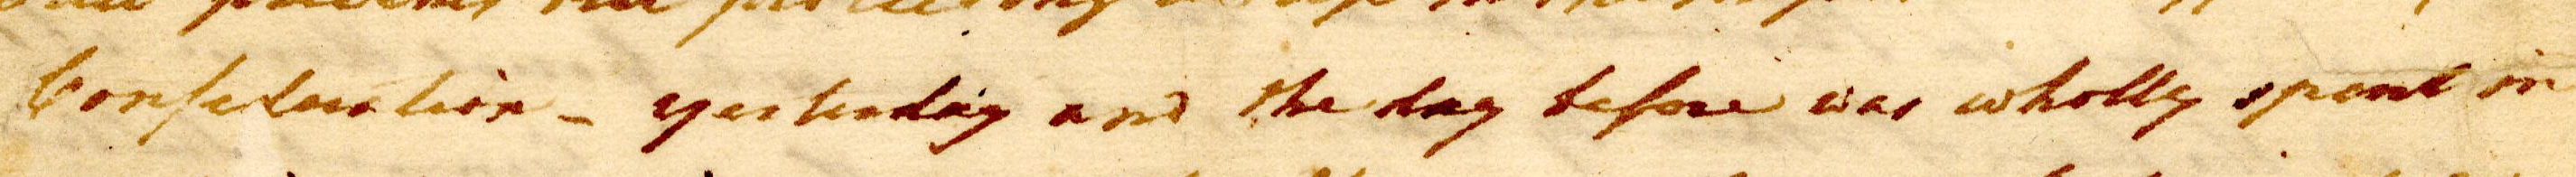Confederation- yesterday and the day before was wholly spent on
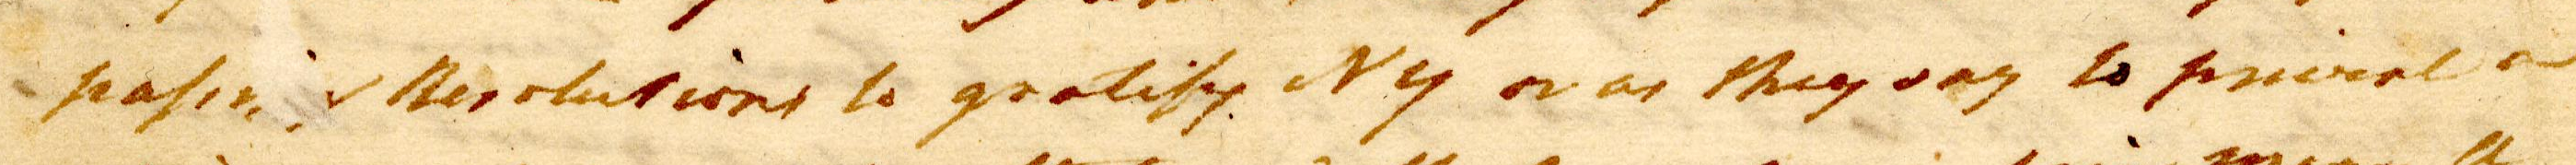passing Resolutions to gratify NY or as they say to prevent a
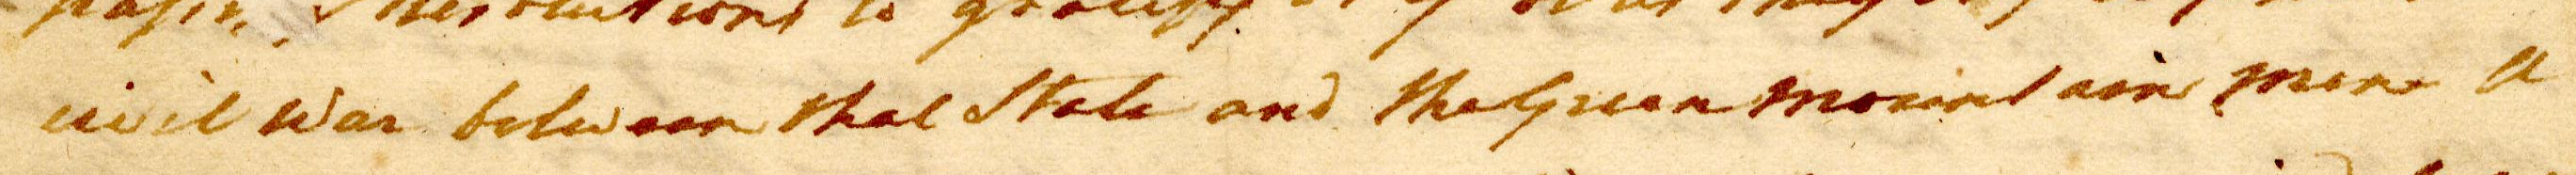civil war between that state and the Green mountain proves a
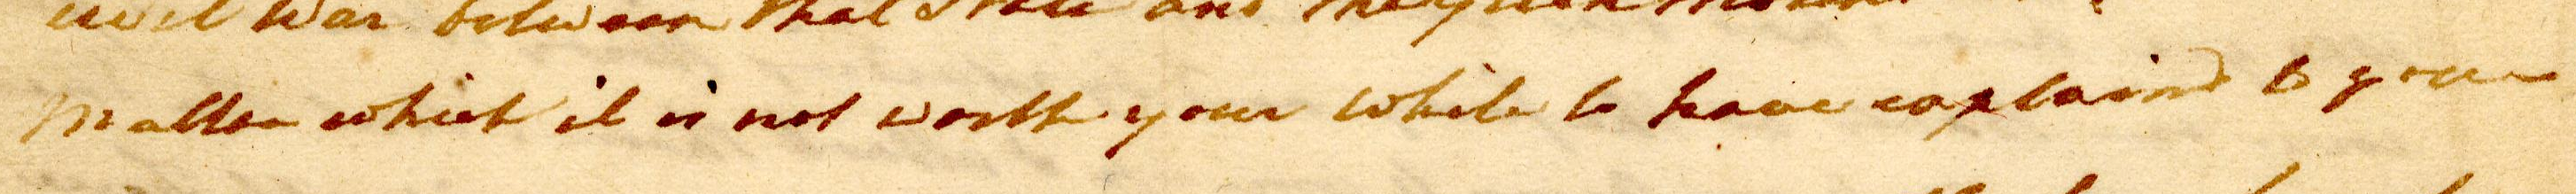Matter which it is not worth your while to have explaind to your
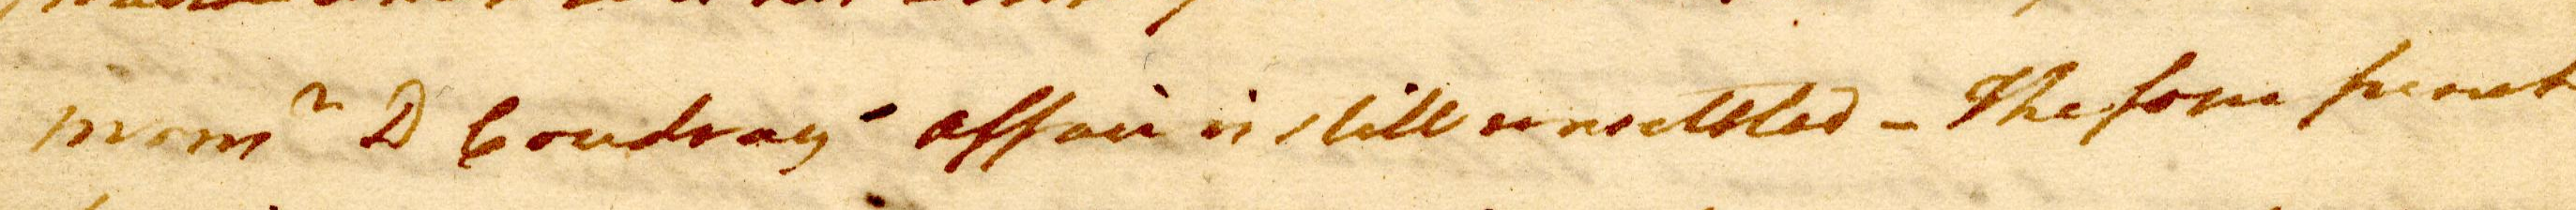mons^r D Coudray affair is still consulted- The four french
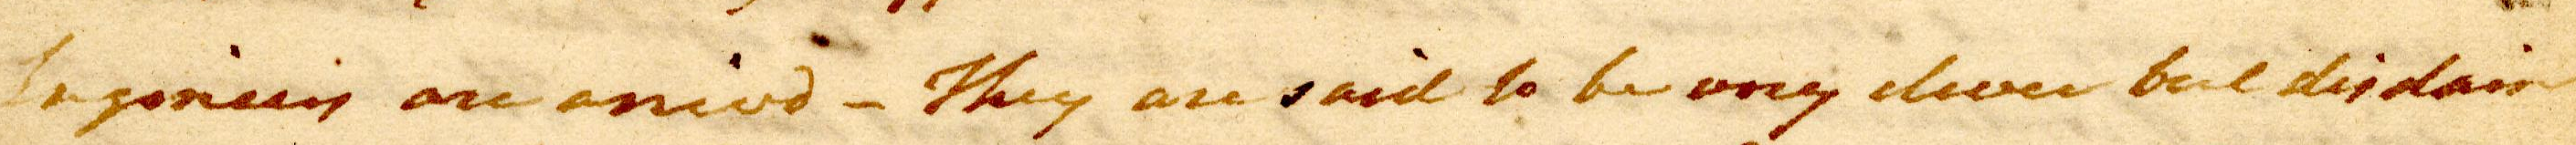Engineers are arrivd- They are said to be every clever but disdain
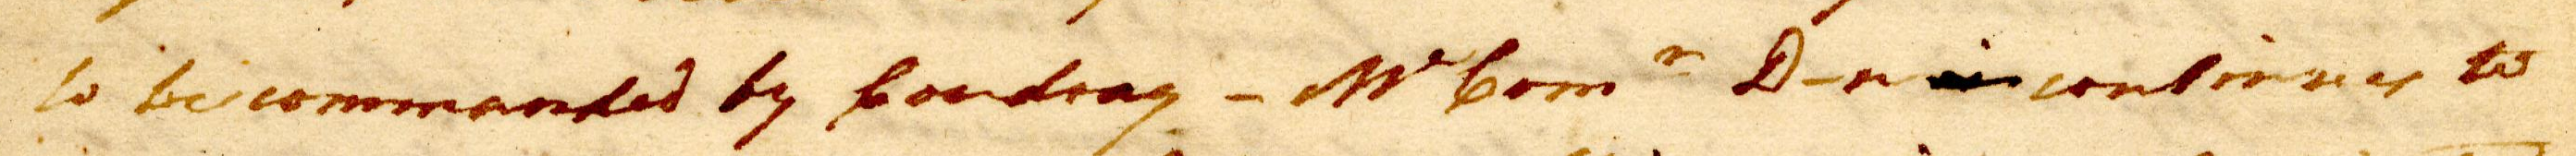to be commanded by Coudray- M^r Com^r. D-n continues to
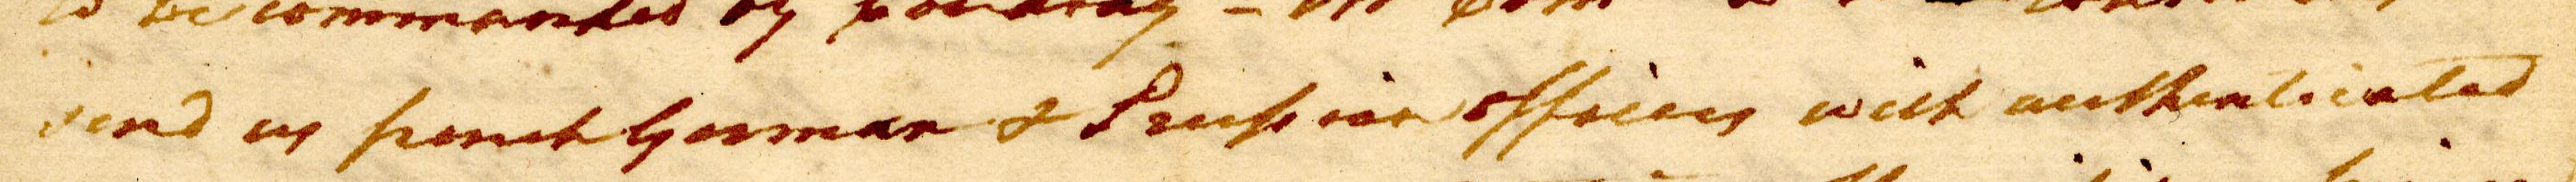send us french German & Prussian officers wich authenticated
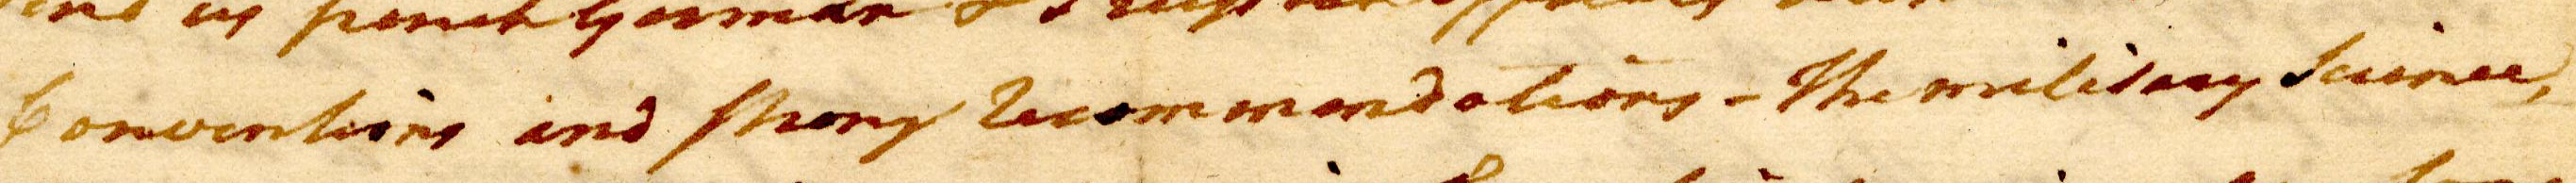Conventions and sherry recommendations- The military service
